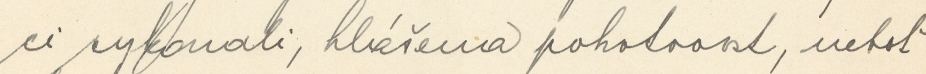ci vykonali, hlášena pohotovost, neboť
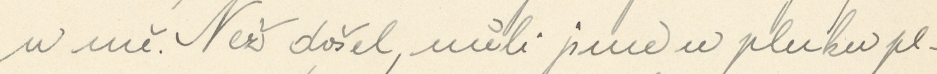u mě. Než došel, měli jsme u pluku pl-
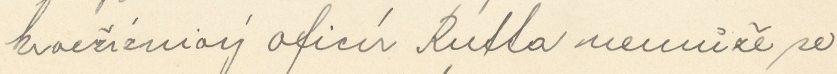krvežíznivý oficír Rutta nemůže se
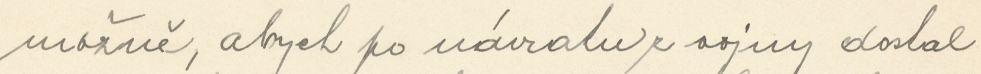možně, abych po návratu z vojny dostal
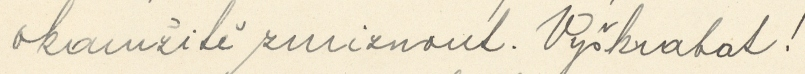okamžitě zmiznout. Vyškrabat!
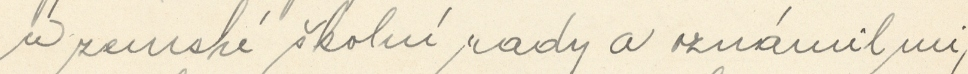u zemské školní rady a oznámil mi,
